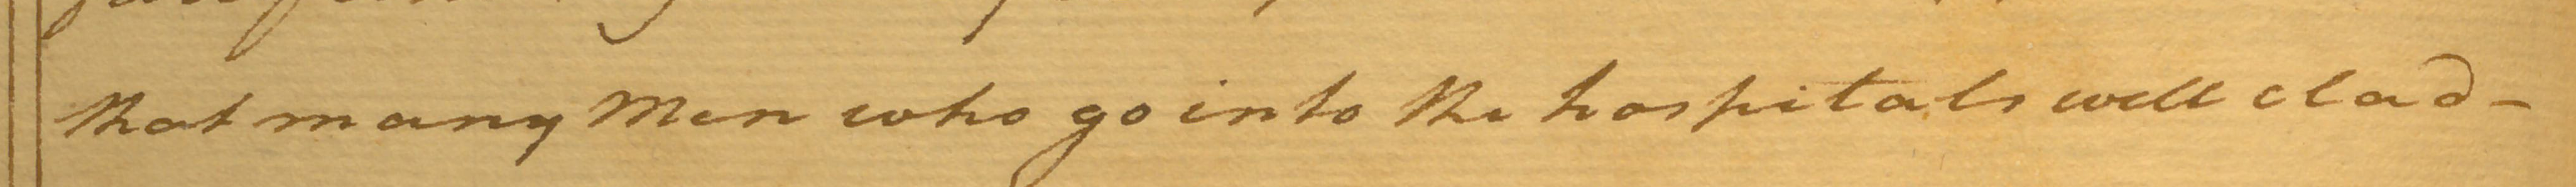that many Men who go into the hospitals well clad-
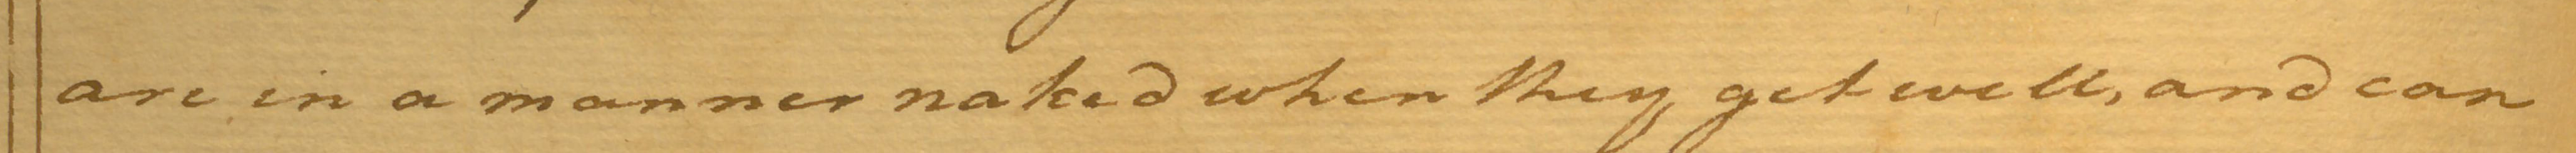are in a manner naked when they get well, and can
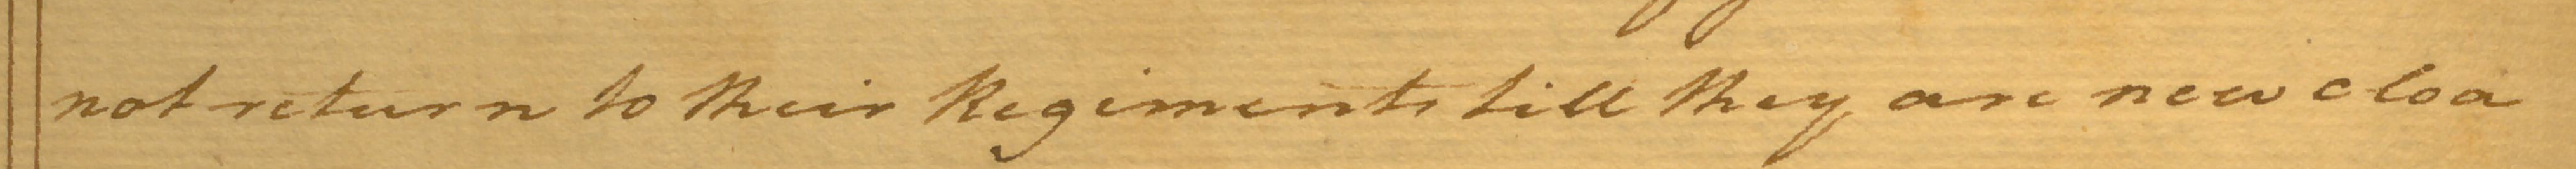not return to their Regiments till they are new cloa
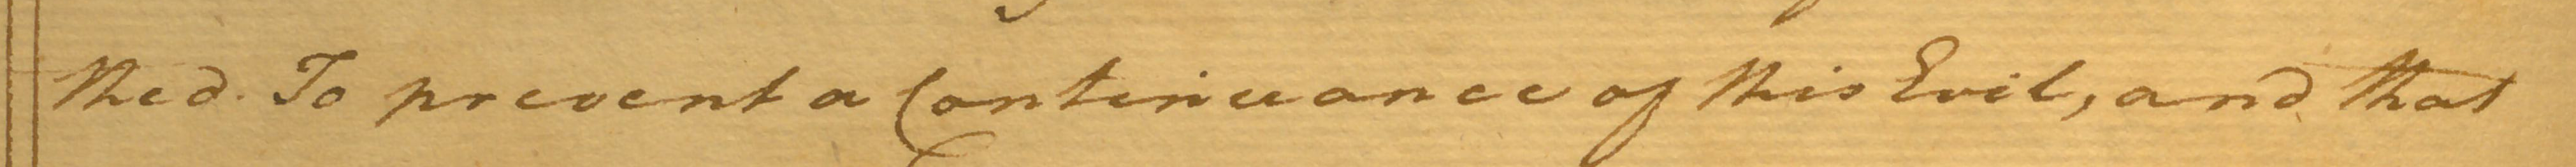thed. To prevent a Continuancy of this Evil, and that
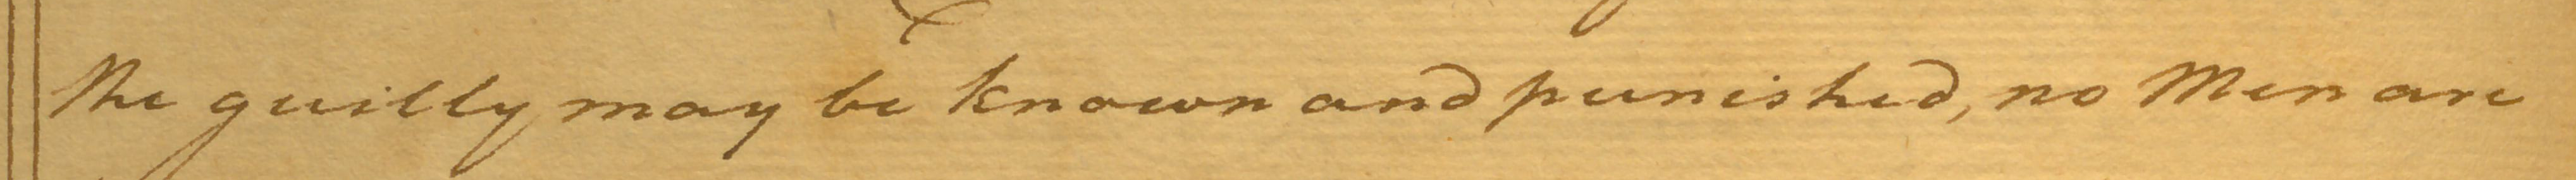the guilty may be known and punished, no Men are
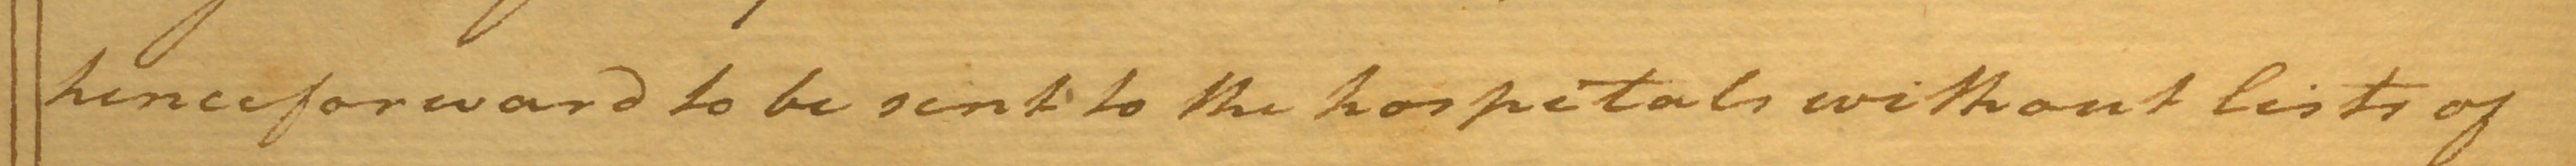henceforward to be sent to the hospitals without lists of
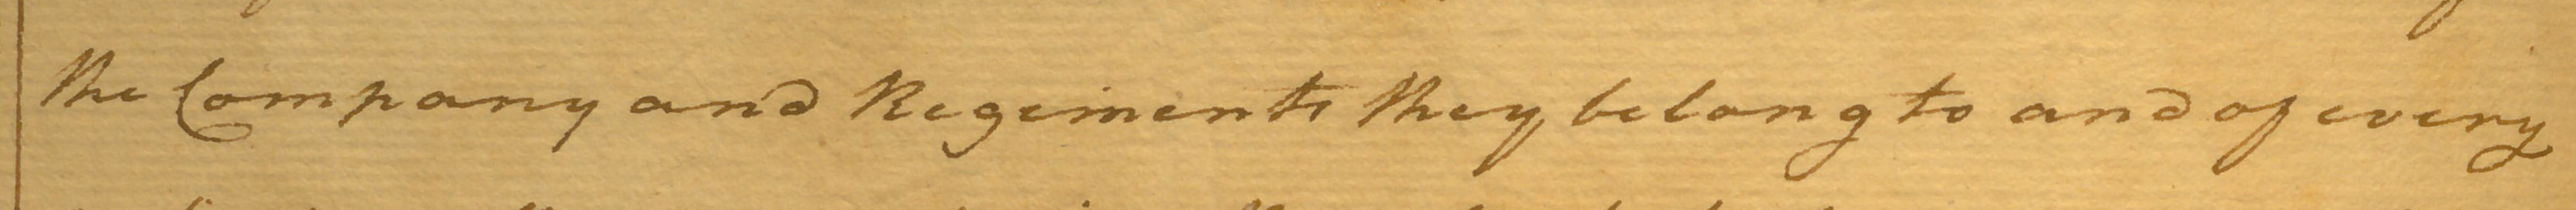the Company and Regiments they belong to and of every
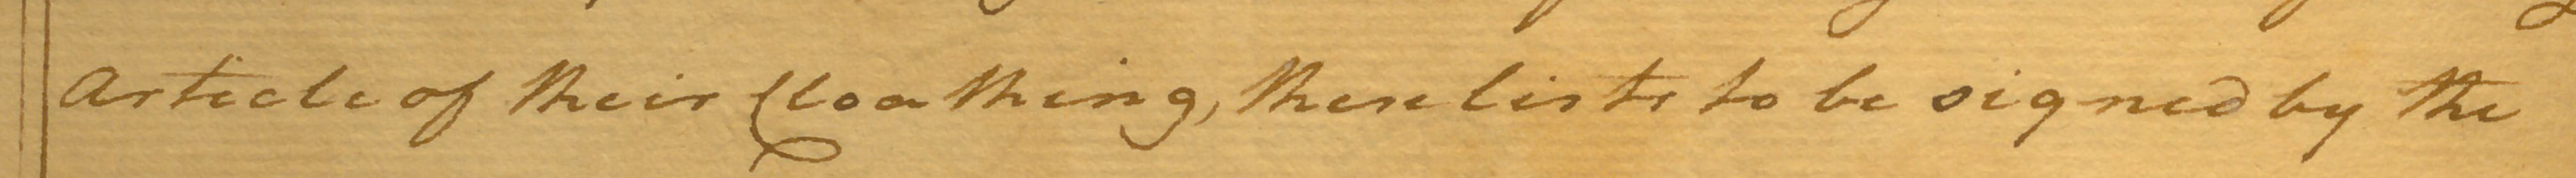Article of their Cloathing, these lists to be signed by the
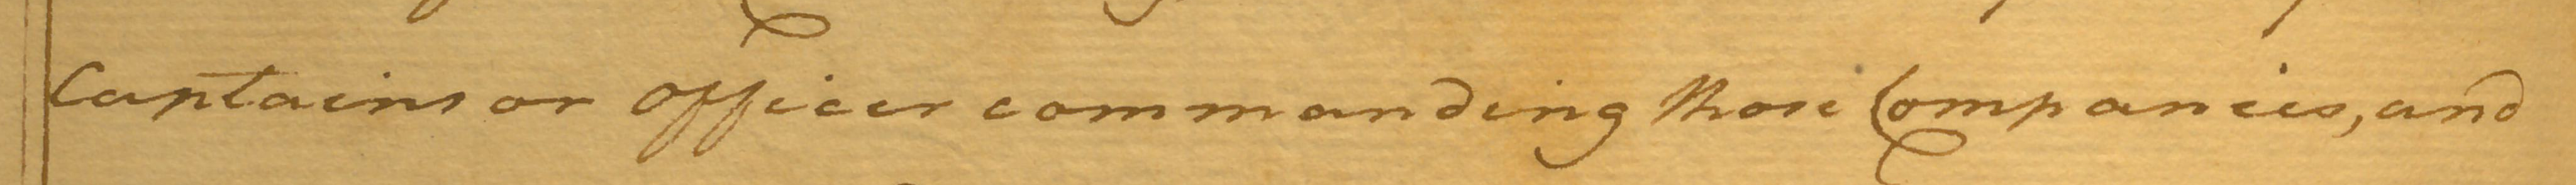Captains or officer commanding those Companies, and
